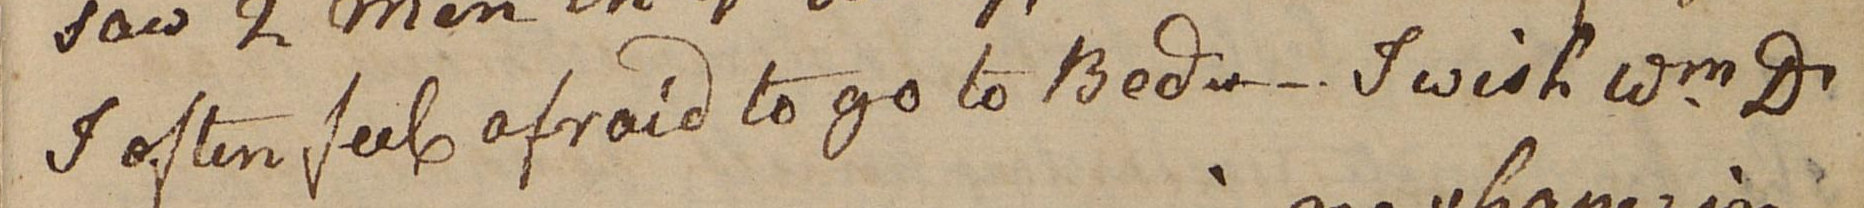I often feel afraid to go to Bed-- I wish W^m.D
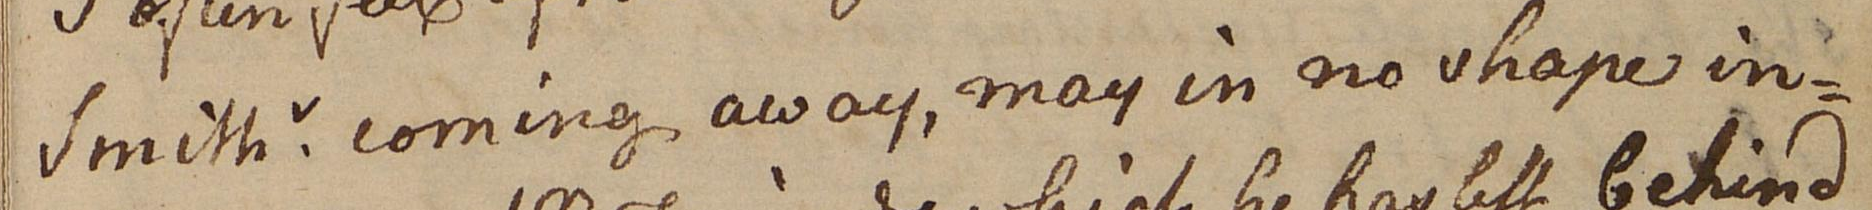Smith^s. coming away, may in no shape in-
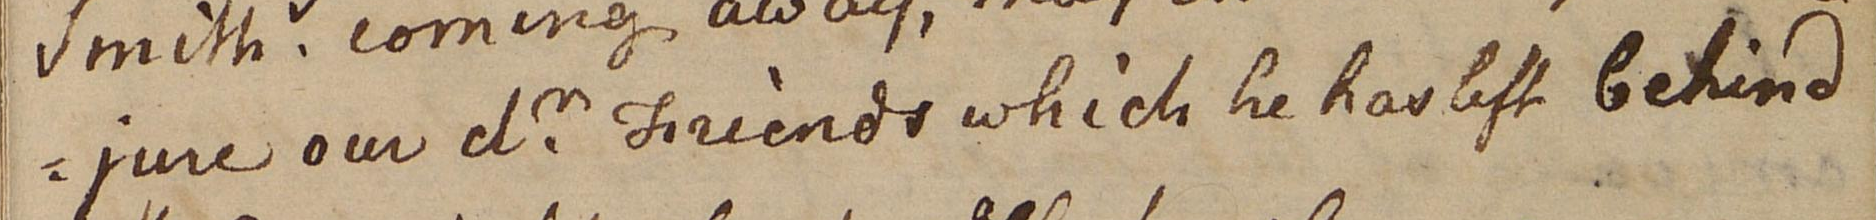-jure our d^r. Friends which he has left behind
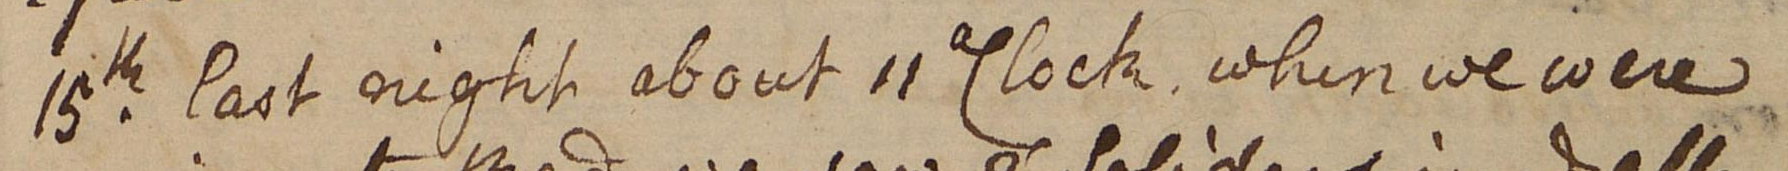15^th last night about 11 ^oClock when we were
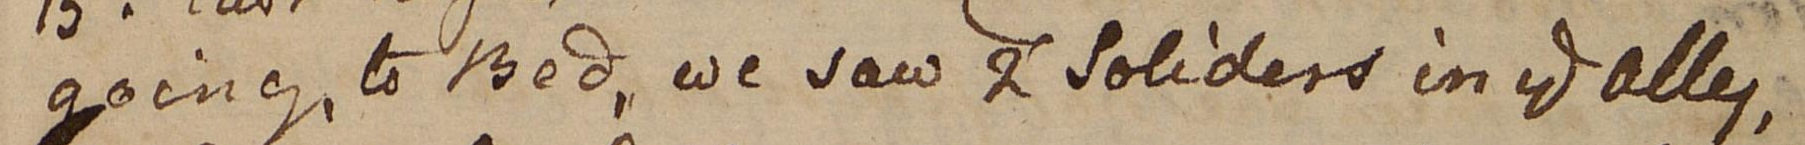going, to Bed, we saw 2 Soliders in y^e ally,
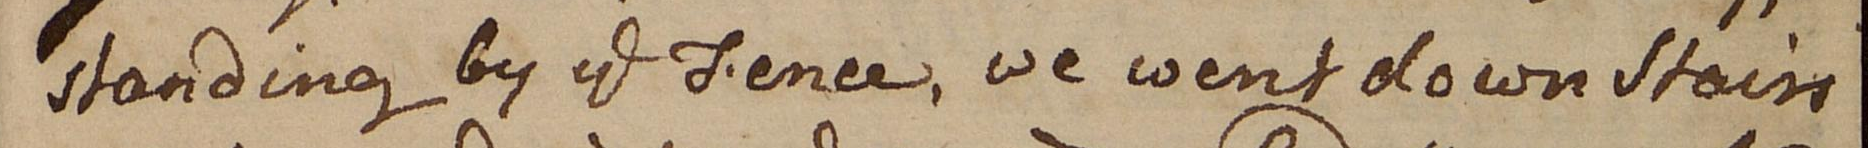standing by y^e Fence, we went down Stairs
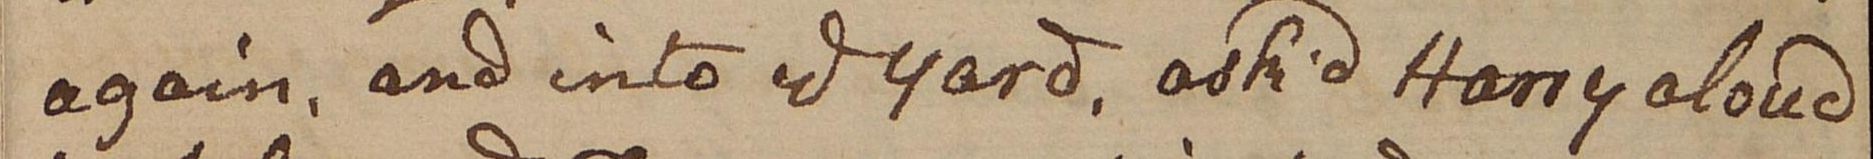again, and into y^e yard, ask'd Harrny aloud
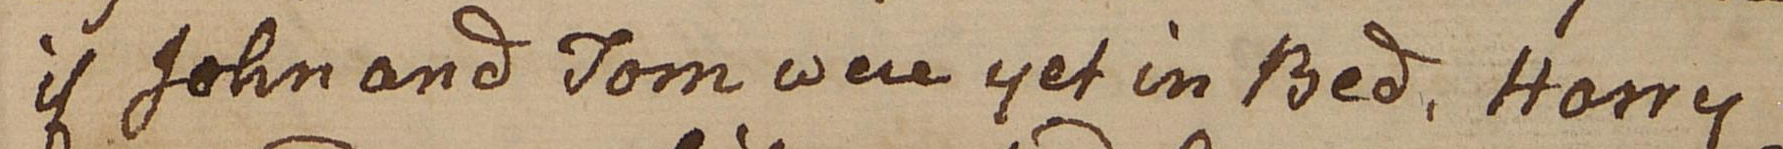if John and Tom were yet in Bed. Harry
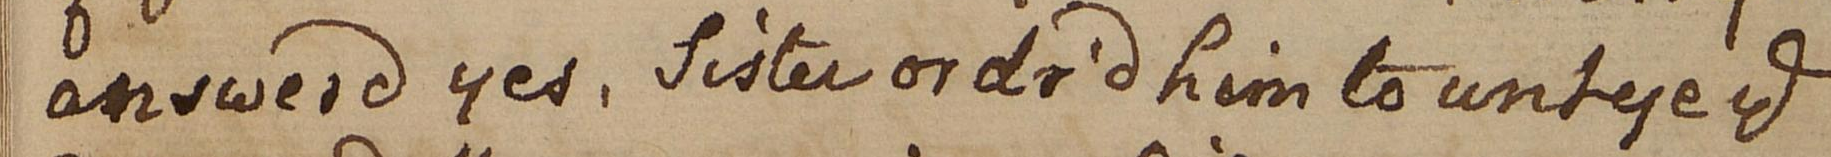answerd yes, Sister ordr'd him to untye y^e
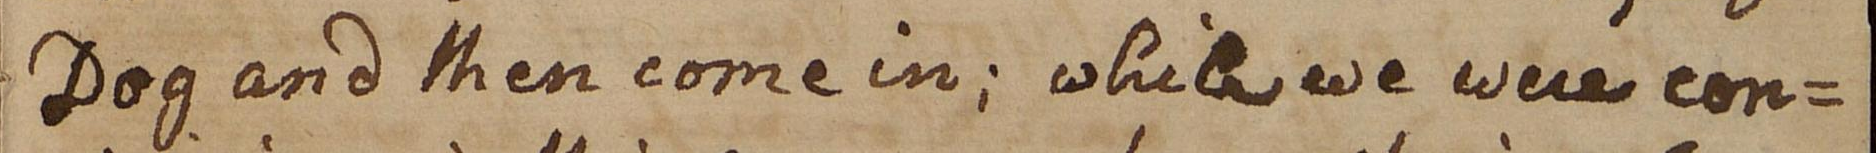Dog and then come in; while we were con-
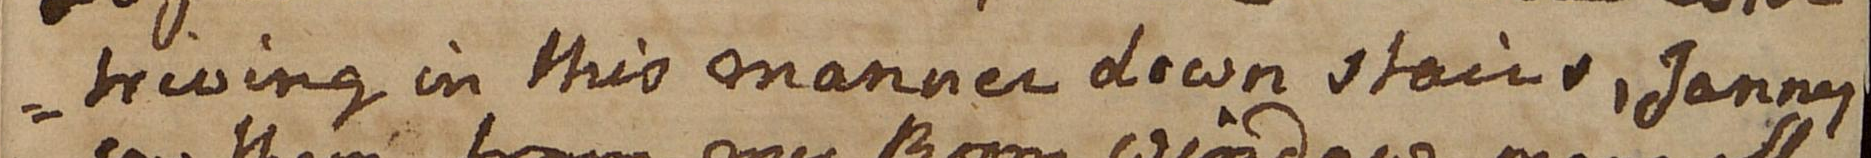-triving in this manner down stairs, Janny
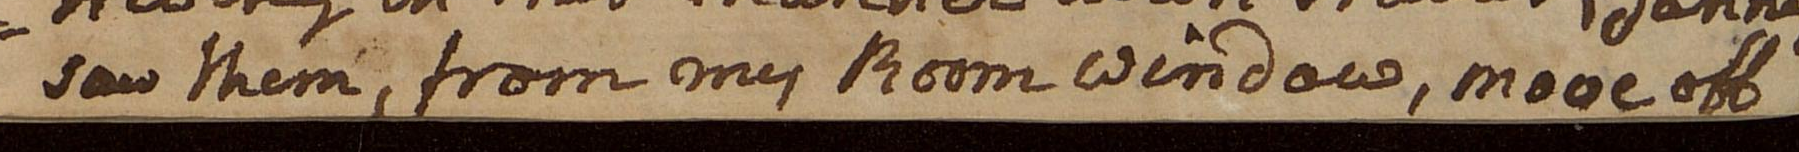saw them, from my Room Window, move off
